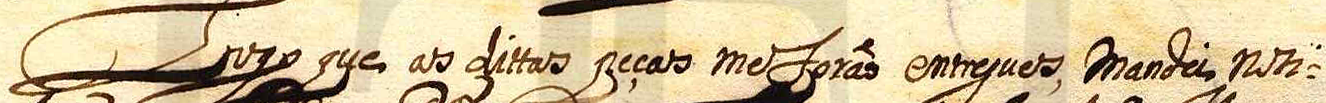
Logo que as dittas peças me forão entregues, mandei noti
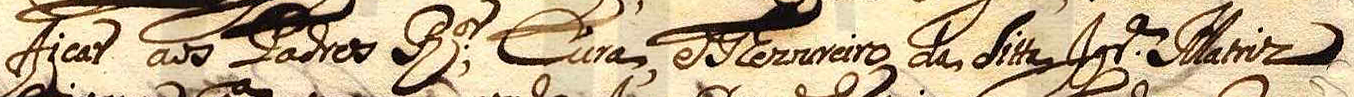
ficar aos Padres R.or; Cura e Thezoureiro da ditta Jgr.a Matriz
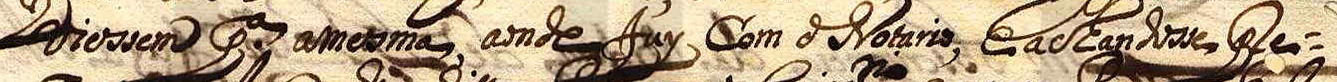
viessem p.a a mesma, aonde fuy Com o Notario, e achandosse pRe
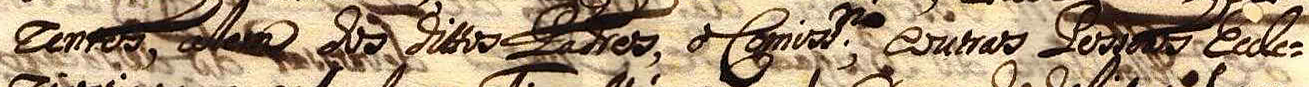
zentes, alem dos dittos Padres, o Comiss.rio, e outras Pessoas Eccle
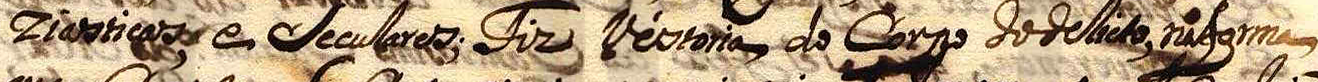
ziasticas, e Seculares; Fiz Véstoria do Corpo do delicto, na forma
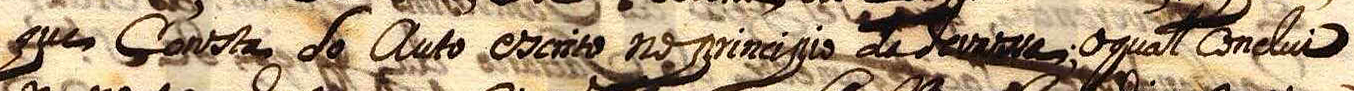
que Consta do Auto escrito no principio da devassa; o qual Conclui
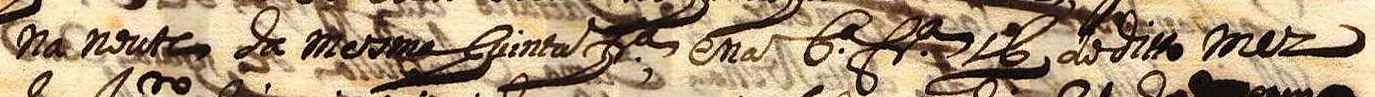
na noute da mesma Quinta f.a, e na 6.a fra 16 do ditto mez
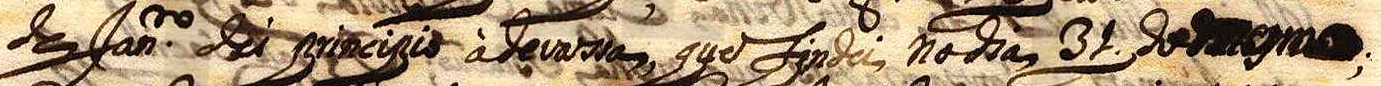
de Jan.ro dei principio à devassa, que findei no dia 31. do mesmo;
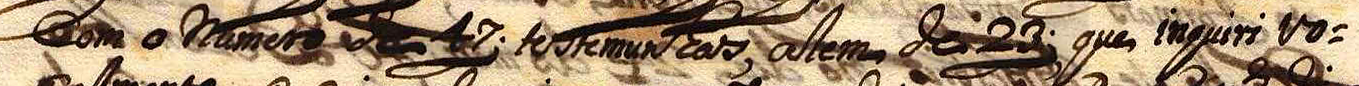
Com o Numero de 47. testemunhas, alem de 23; que inquiri vo
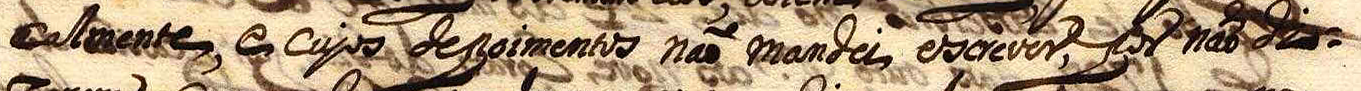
calmente, e cujos depoimentos, naõ mandei escrever por naõ di
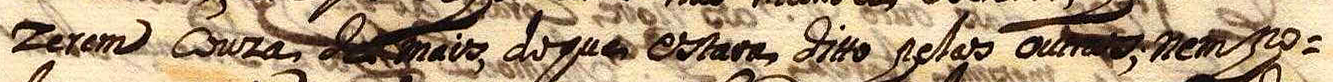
zerem couza de mais, do que estava ditto pelas outras, nem po
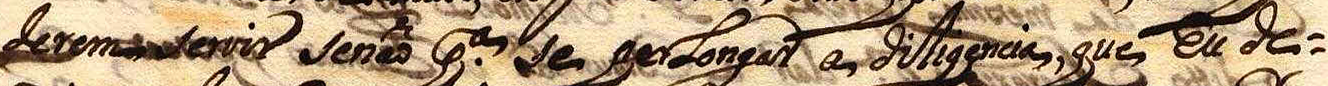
derem servir se naõ p.a se perLongar a diligencia, que Eu de
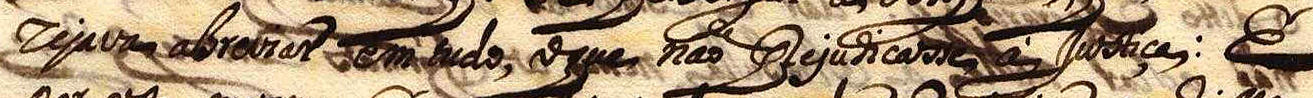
zejava abreviar em tudo, o que naõ prejudicasse á Justiça: E
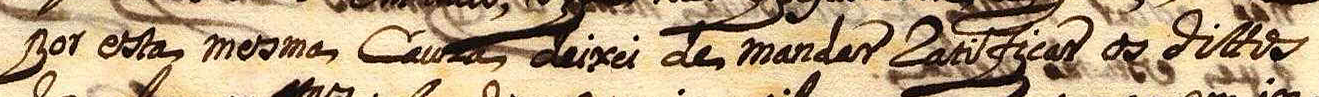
por esta mesma Cauza deixei de mandar Ratificar os dittos
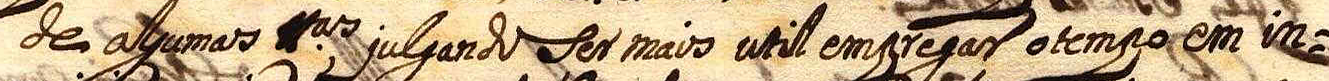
de algumas tt.as julgando ser mais util empregar o tempo em in
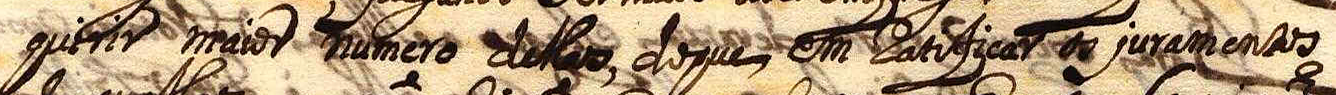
quirir maior numero dellas, do que em Ratificar os juramentos
